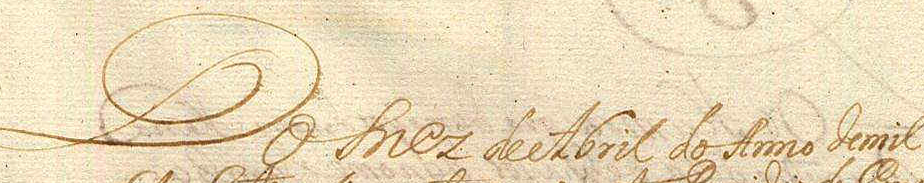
Do Mez de Abril do Anno de mil
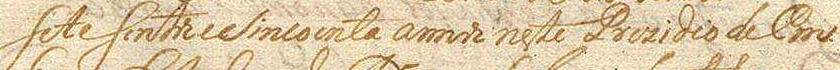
setesentos e sincoenta annos neste Prezidio de Em
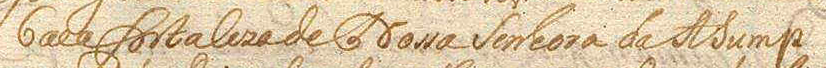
baca fortaleza de Nossa Senhora da ASump
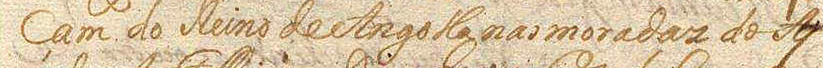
Çam do Reino de Angolla nas moradaz do Aj
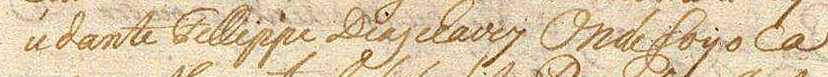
udante Fellippe Dias chaves Onde foy o Ca
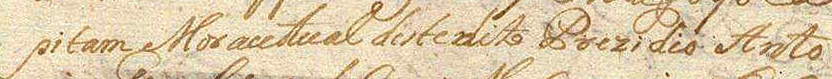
pitam Mor autual deste dito Prezidio Anto
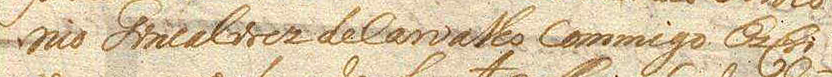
nio Gonçalvrez de Carvalho Commigo EzCri
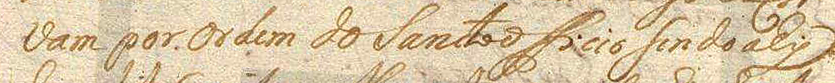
vam por ordem do Sancto officio sendo ahy
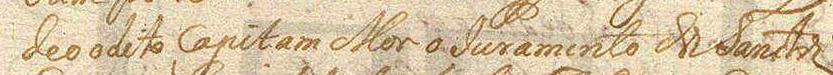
deo o dito Capitam Mor o Iuramento dos Sanctos
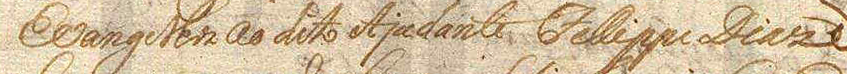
Evangelhos ao dito Ajudante Fellippe Diaz
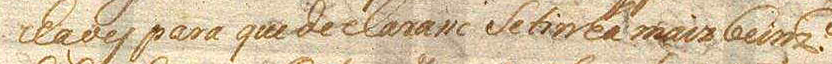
chaves para que declarasse se tinha maiz beinz.
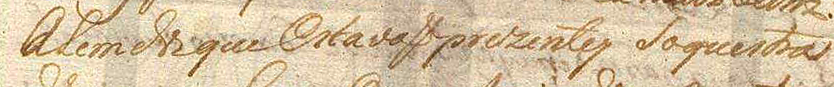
Alem dos que Estavaõ prezentes soquestra
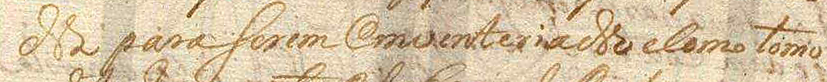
dos para serem emventeriados e Como tomo
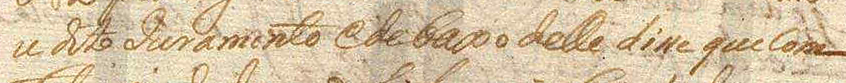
u dito Iuramento e debaxo delle disse que com
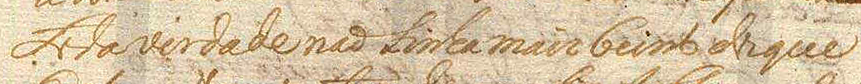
toda verdade naõ tinha maiz beins dos que
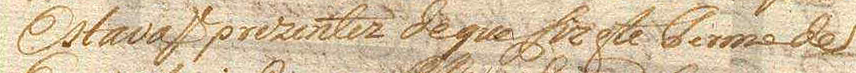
Estavaõ prezentez de que fiz este Termo de
